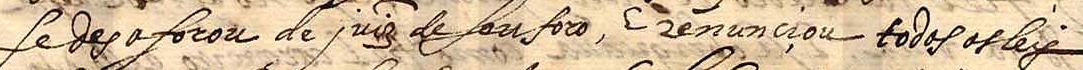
Se desaforou de juīz de Seu foro, E renunçiou todas as leis
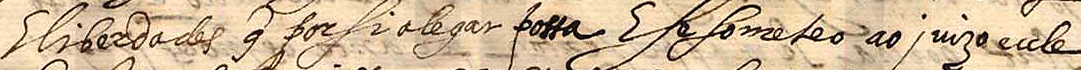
E liberdades q̄ por si alegar possa E se someteo ao juizo eccle
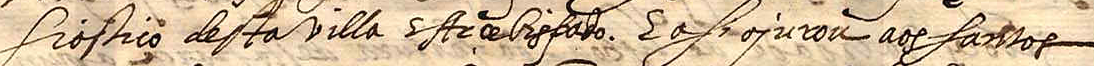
Siastico desta villa E Arçebispado. E asi o jurou aos Santos
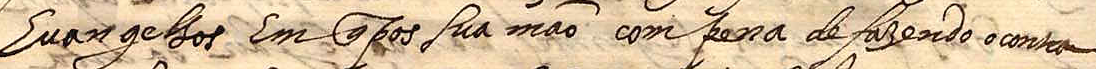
Euangelhos Em q̄ pos sua mão com pena de fazendo o contra
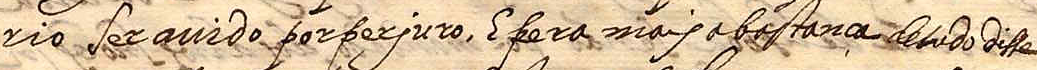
rio ser auido por perjuro, E pera mais abastança de tudo disse
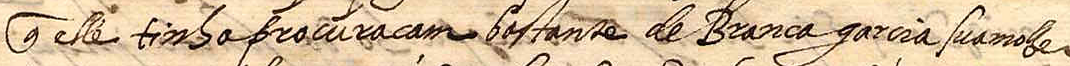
q̄ elle tinha procuraçam bastante de Branca garçia sua mulher
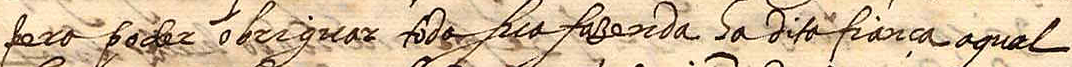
pera poder obriguar toda sua fazenda ha dita fiança a qual
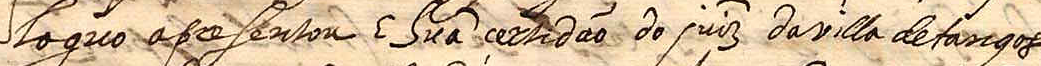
loguo apresentou E huā certidão do juīz da villa de tanqos
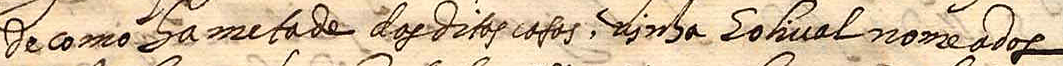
de como ha metade das ditas casas, uinha E oliual nomeados
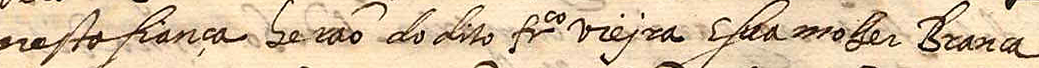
nesta fiança herão do dito frco viejra E sua mulher Branca
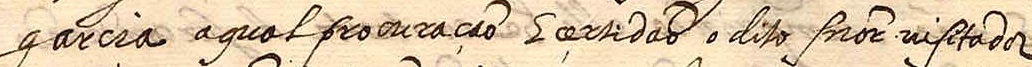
garçia a qual procuração E çertidão o dito snor̄ visitador
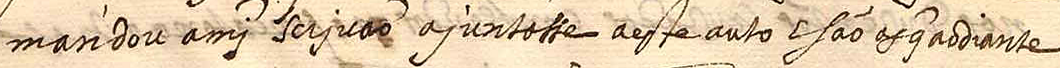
mandou a mj̄ scrjuão ajuntasse a este auto E são as q̄ ao diante
